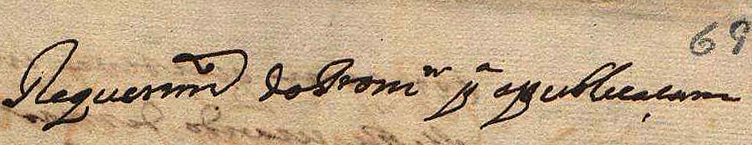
Requerimto do Prom.or pa a publicaçam
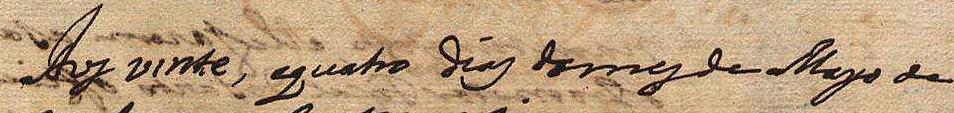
Aos vinte, e quatro dias do mes de Mayo de
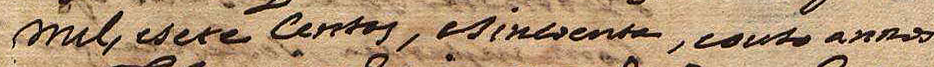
mil, e setecentos, e sincoenta, e outo annos
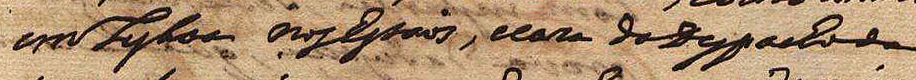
em Lisboa nos Estaos, e caza do Despacho da
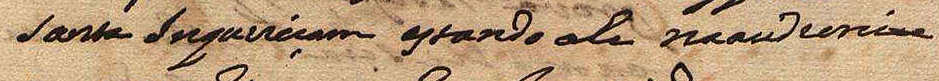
santa Inquiziçam estando ahi na audiencia
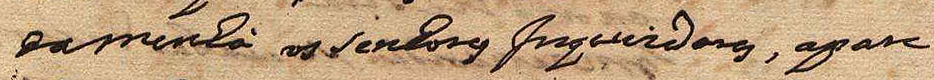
da menhã os senhores Jnquizidores, apare
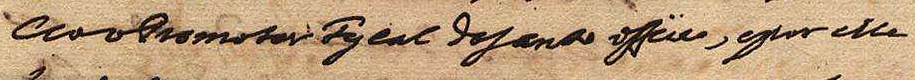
ceo o Promotor Fiscal do santo officio, e por elle
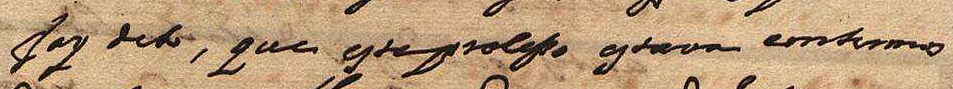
foy dito, que este processo estava em termo
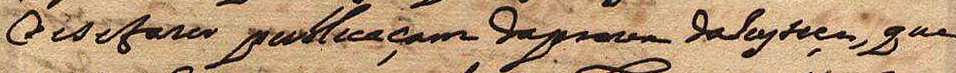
de se fazer publicaçam da prova da Iustiça, que
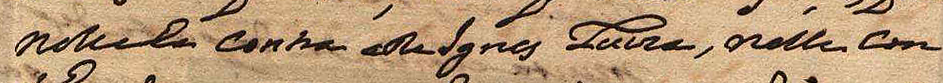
nelle ha contra a Re Ignes Luiza, nelle con
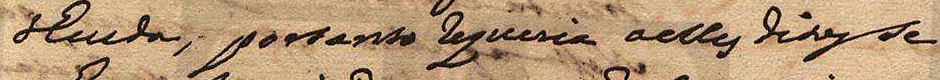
theuda, portanto Requeria a elles ditos se
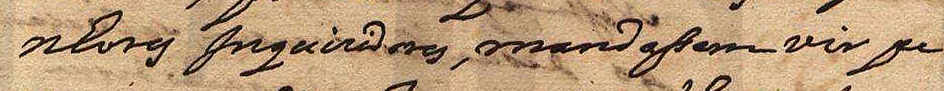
nhores Jnquizidores, mandassem vir pe
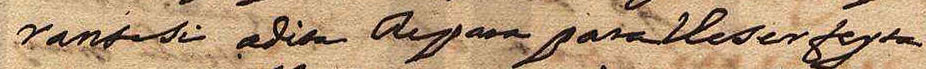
rante si a dita Re para para lhe ser feyta
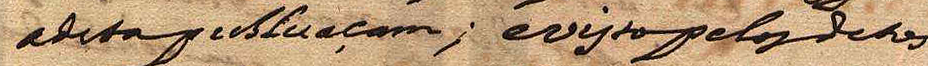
a dita publicaçam; e visto pelos ditos
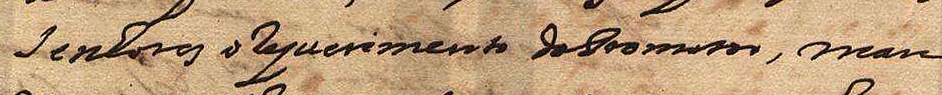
senhores o Requerimento do Promotor, man
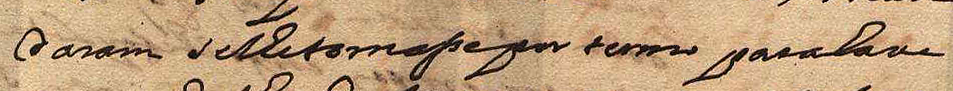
daram se lhe tomasse por termo para have
